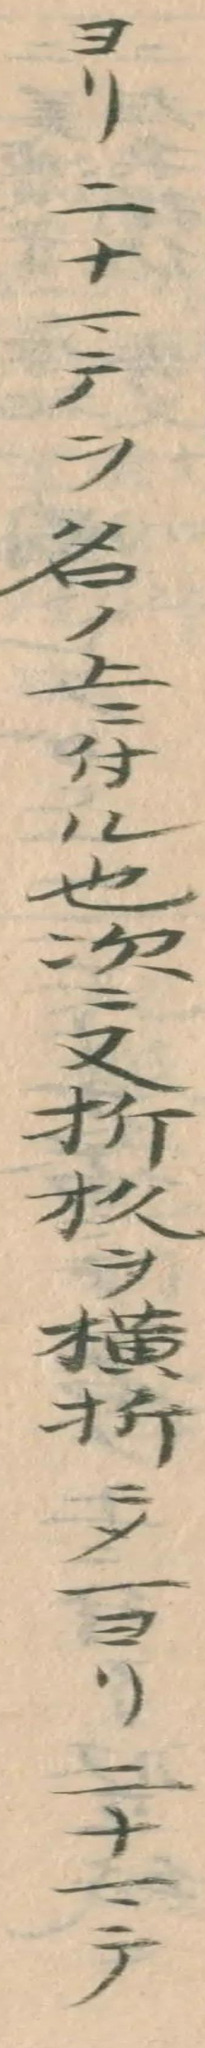ヨリ二十マテヲ名ノ上ニ付ル也次ニ又折杦ヲ横折ニシテ一ヨリ二十マテ
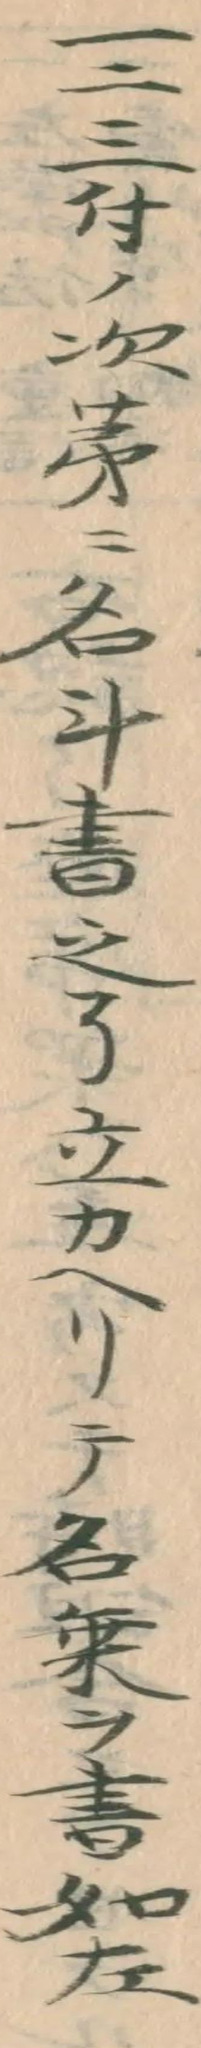一二三付ノ次第ニ名斗書之了立カヘリテ名乗ヲ書如左

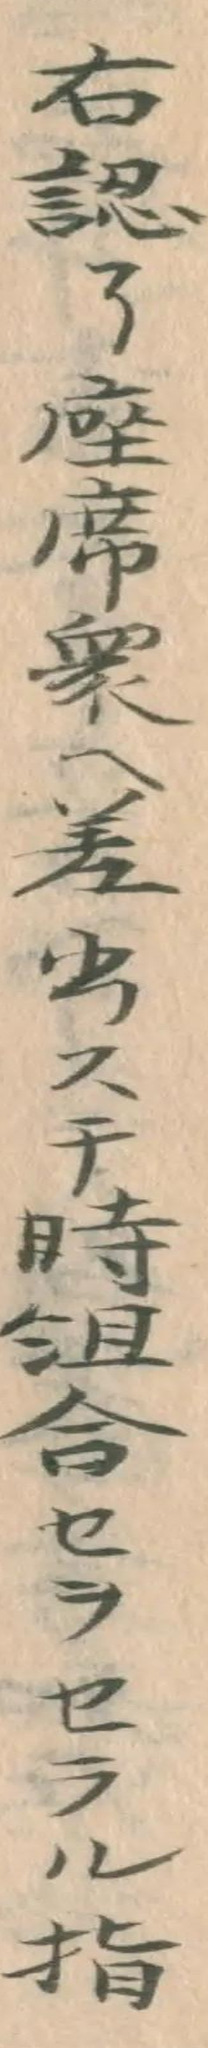右認了座席衆へ差出ス于時組合セヲセラル指
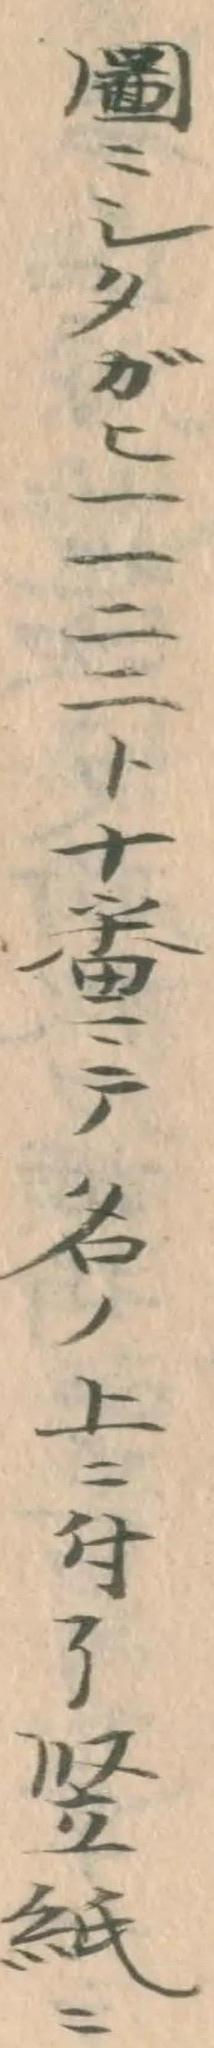圖ニシタガヒ一一二二ト十番マテ名ノ上ニ付了竪紙ニ
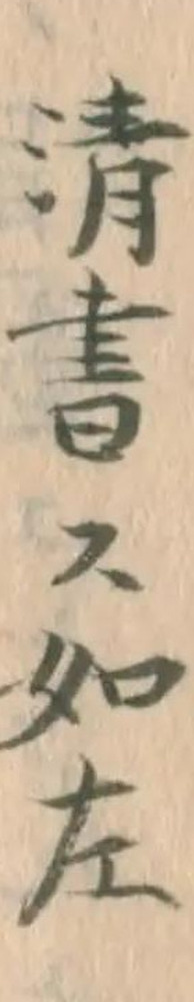清書ス如左
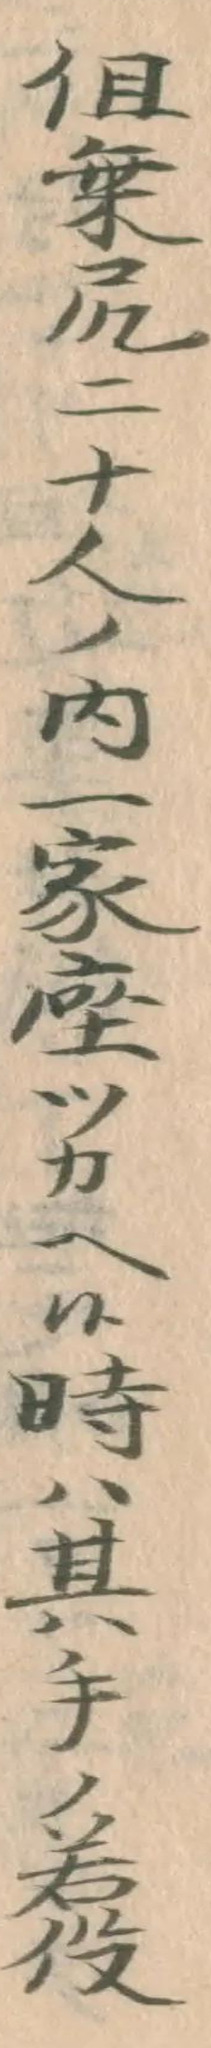但乗尻二十人ノ内一家座ツカヘ候時ハ其手ノ若役
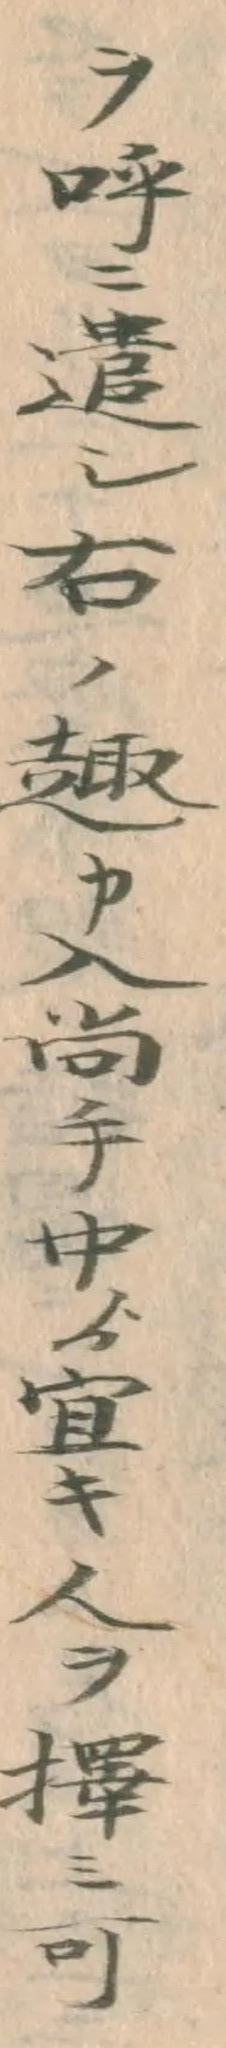ヲ呼ニ遣シ右ノ趣申入尚手中ゟ宜キ人ヲ擇ミ可
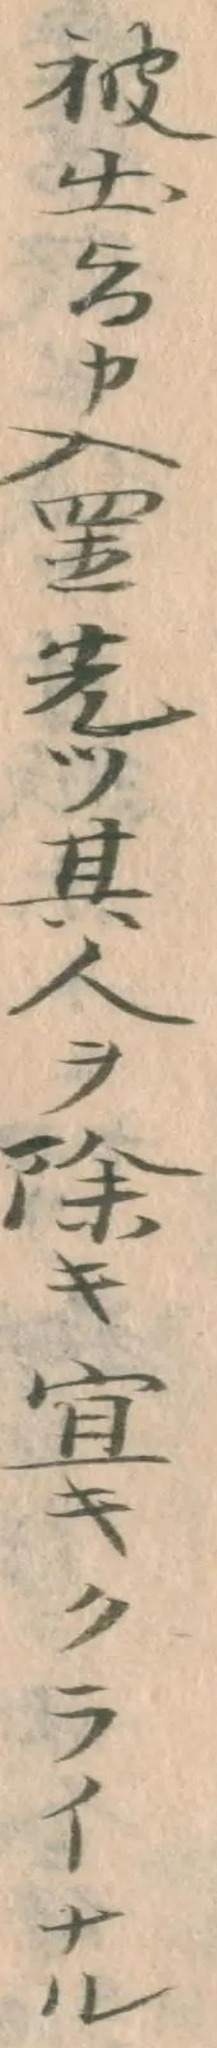被出旨カ入置先ツ其人ヲ除キ宜キクライナル
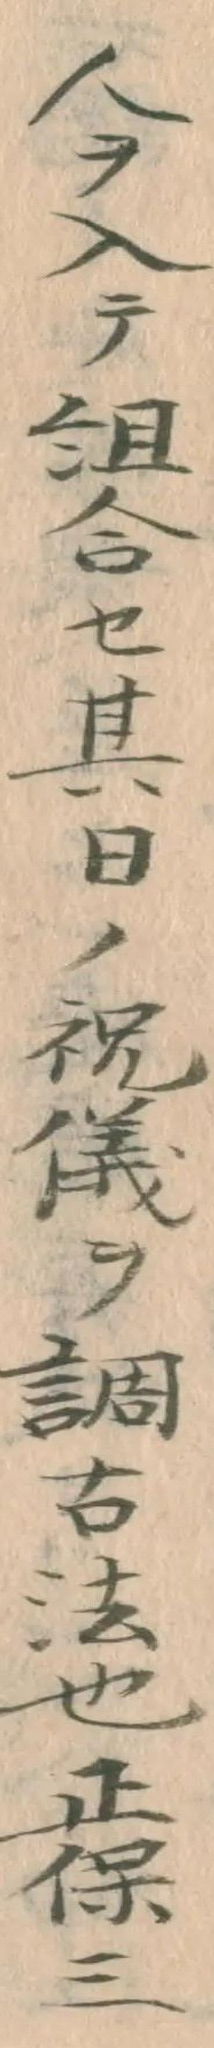人ヲ入テ組合セ其日ノ祝儀ヲ調古法也正保三
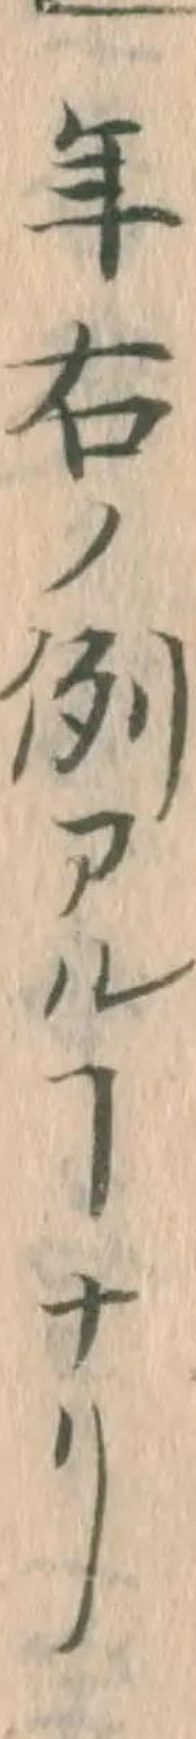年右ノ例アルヿナリ
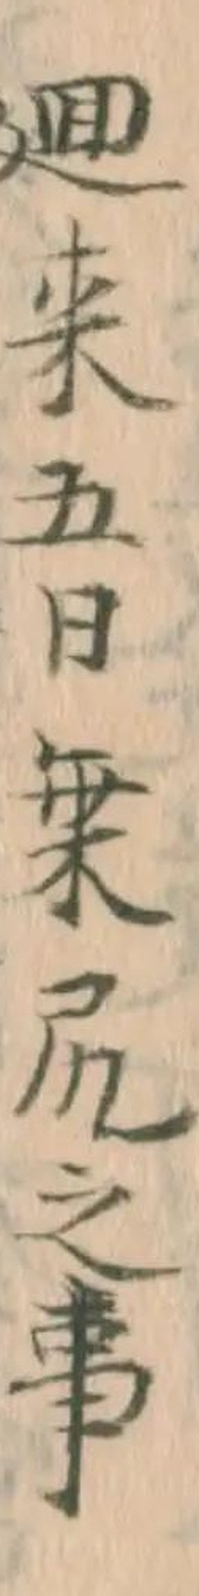廻来五日乗尻之事
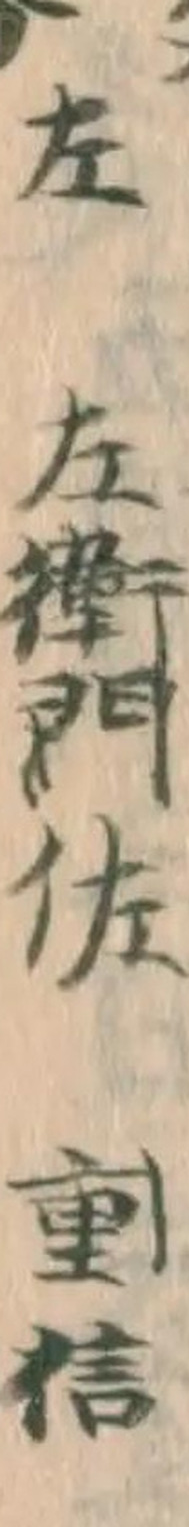一左衛門佐重信
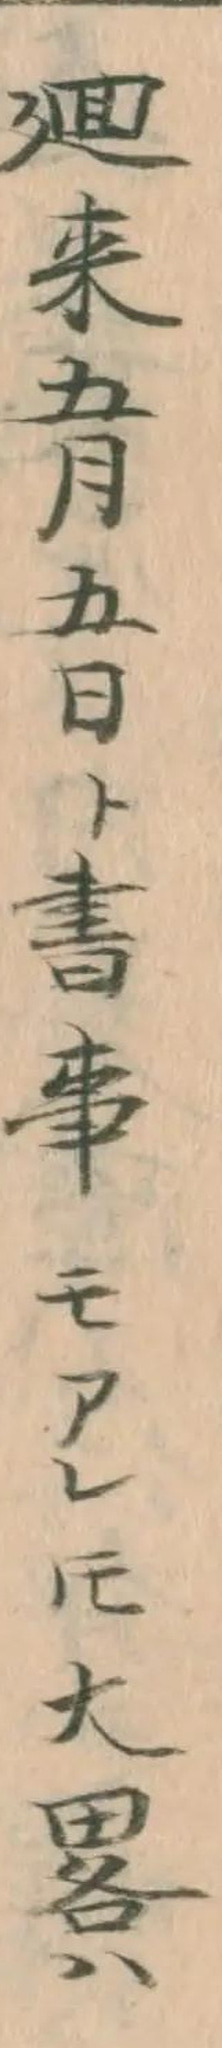廻来五月五日ト書事モアレトモ大畧ハ
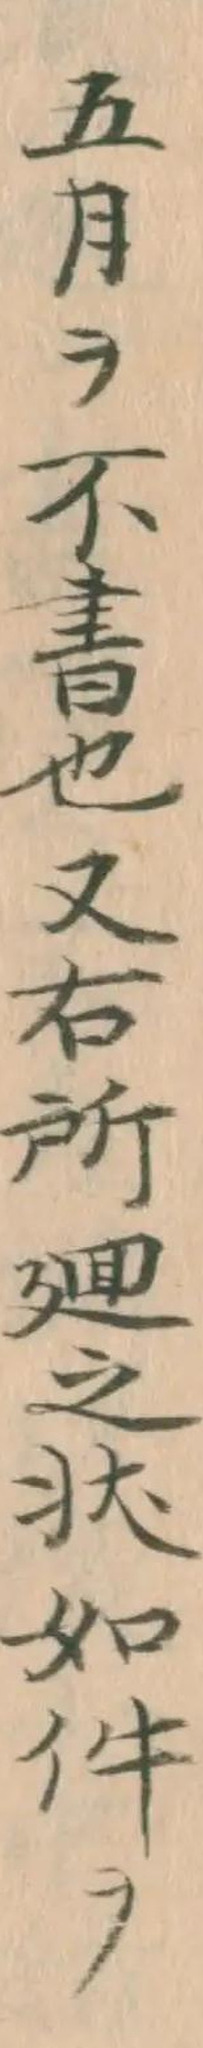五月ヲ不書也又右所廻之状如件ヲ
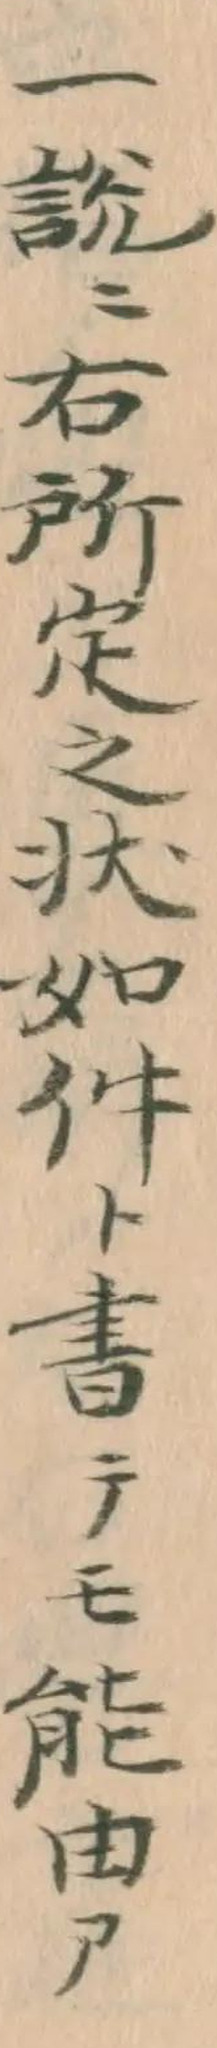一説ニ右所定之状如件ト書テモ能由ア
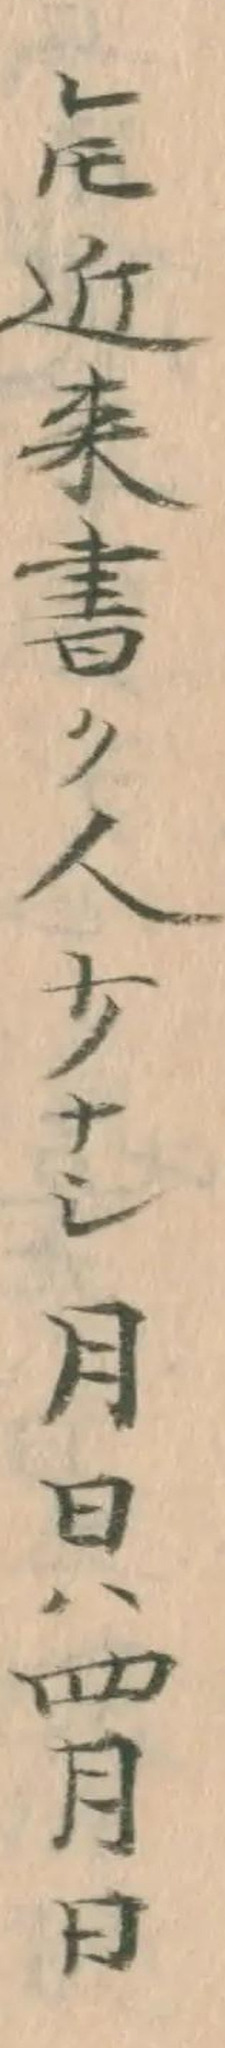レトモ近来書ク人少ナシ月日ハ四月日
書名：賀茂社記録. 第40冊
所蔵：国立国会図書館 National Diet Library, JAPAN
